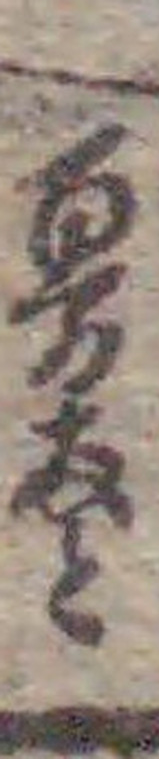百万両と
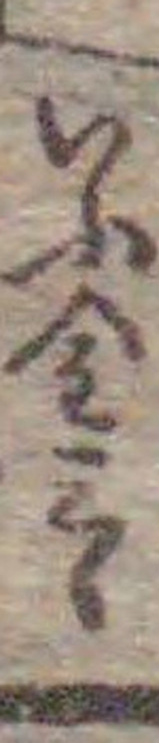いふ金みゝ
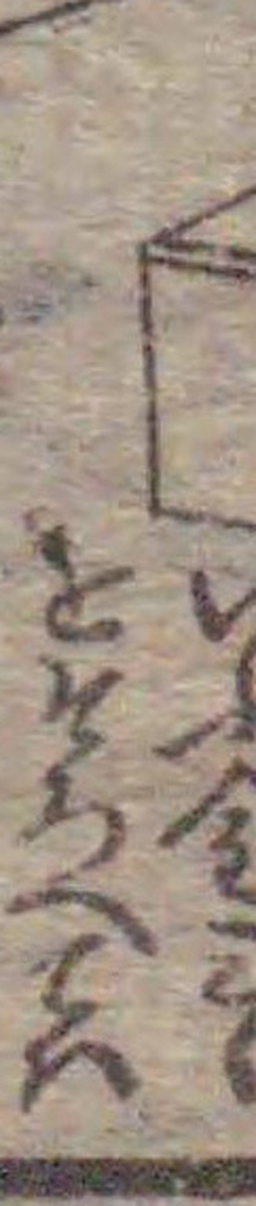をそろへては
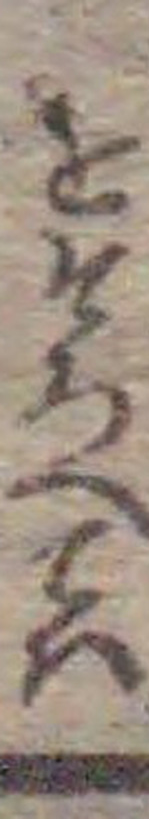をそろへては
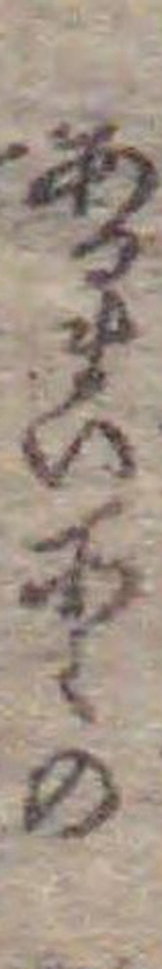あるまい所々の
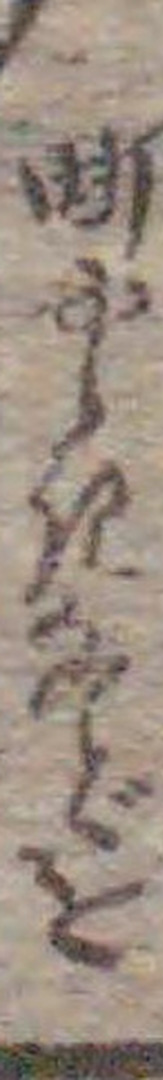町やしきなどを
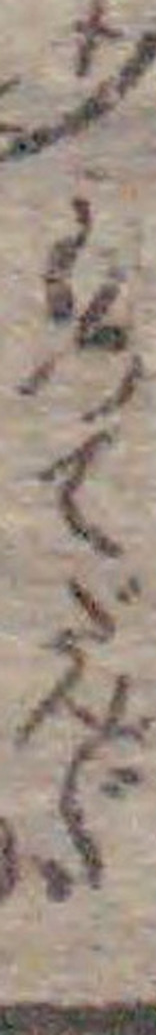もつてだん〴〵に
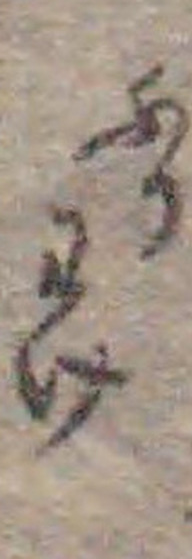ふりわけ
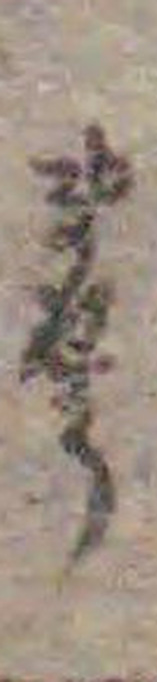ませう

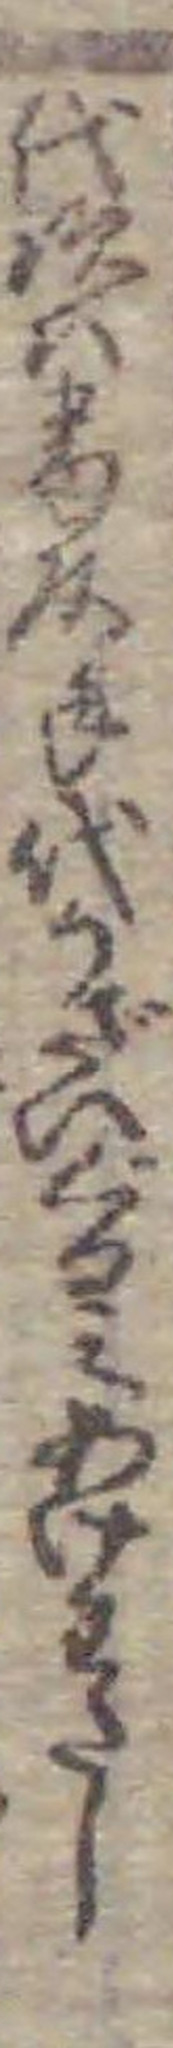代次は番頭手代かざいぐるみあけわたし
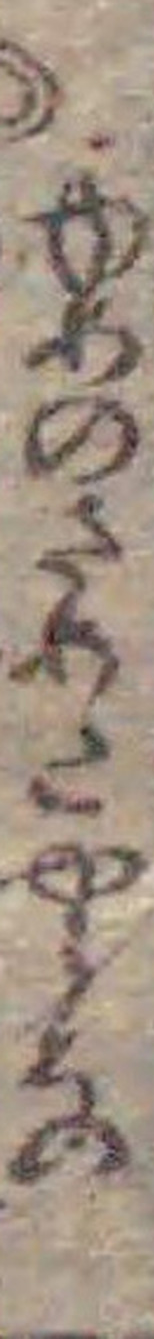ゆめのさめたやうな
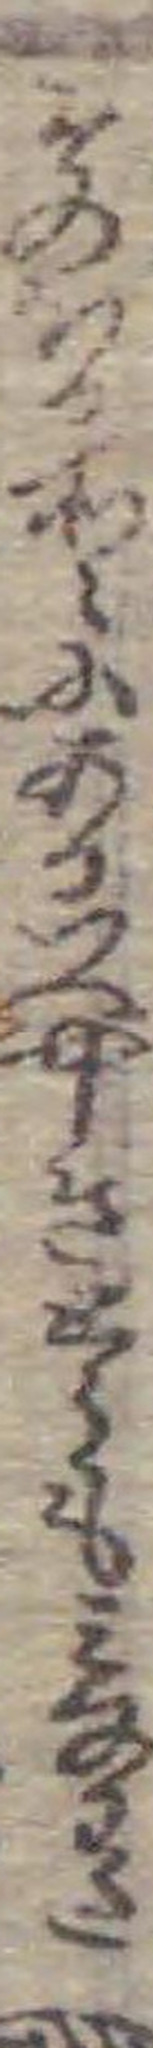そのほか所々にあるいへやしきとうもみなわた
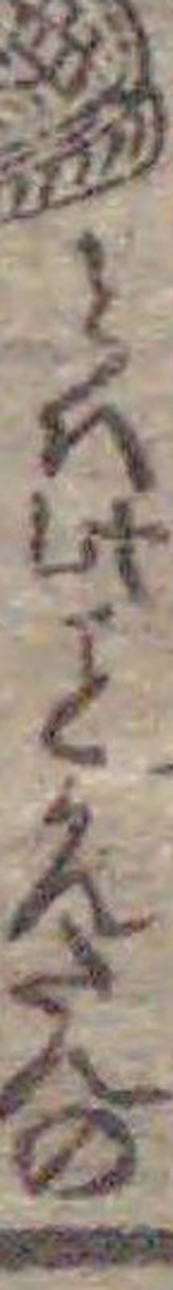とは此ことかんたんの
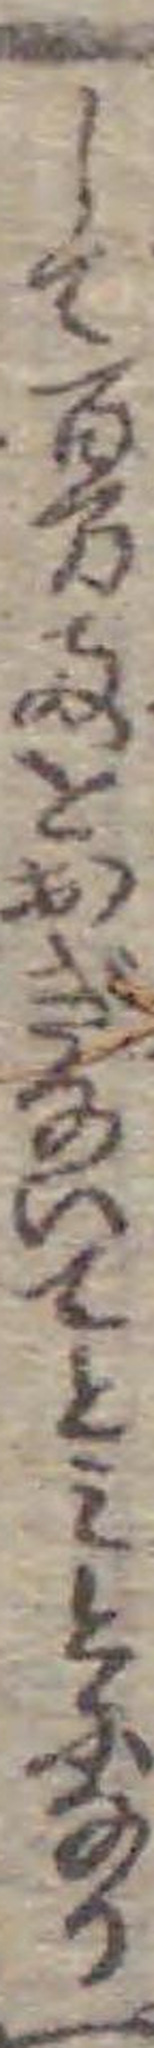して百万両をおぎないてとみとふなり
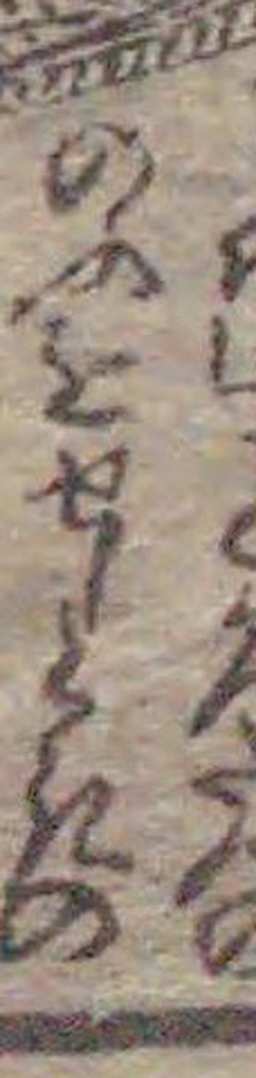のふをせしときの
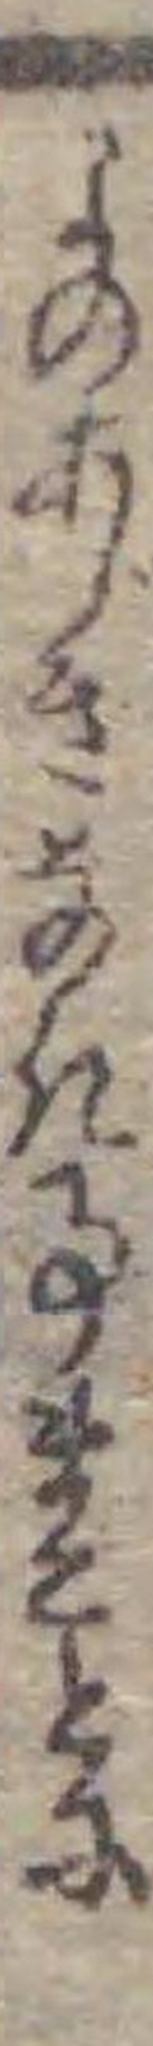よのあじきなき事まことに
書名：見徳一炊夢 : 3巻
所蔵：国立国会図書館 National Diet Library, JAPAN
